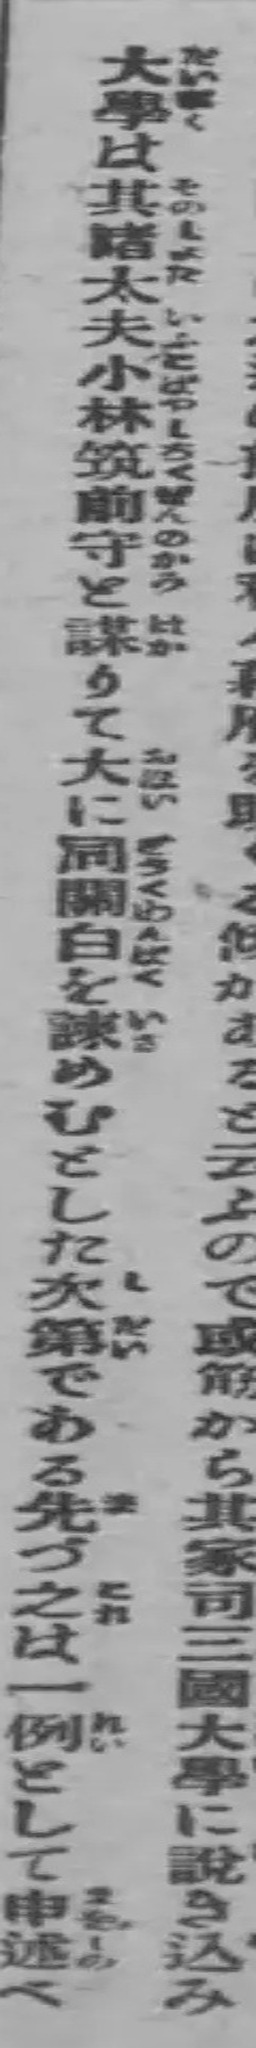大学は其諸太夫小林筑前守と謀りて大に同関白を諌めむとした次第である先づ之は一例として申述べ
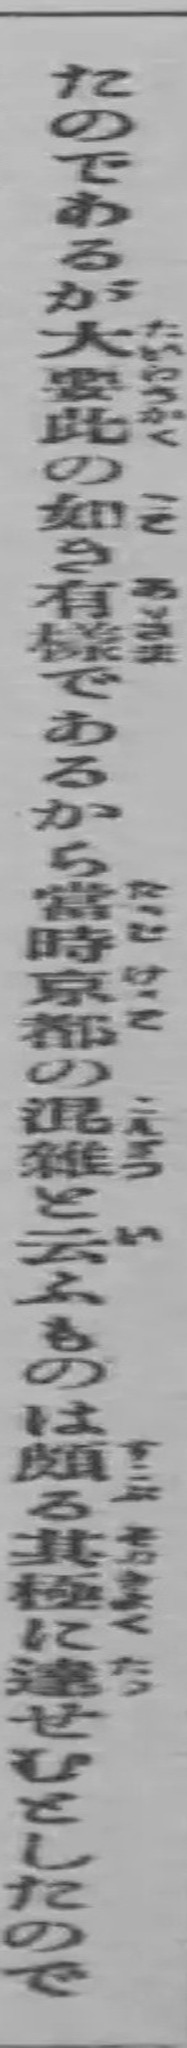たのであるが大要此の如き有様であるから当時京都の混雑と云ふものは頗る其極に達せむとしたので
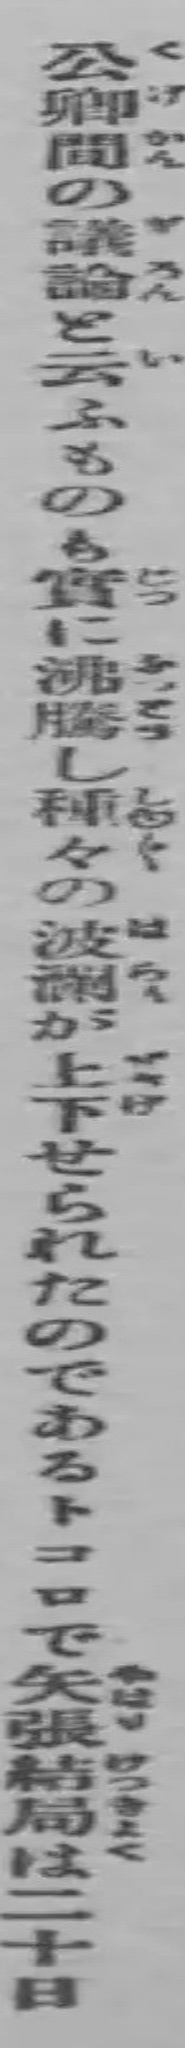公卿間の議論と云ふものも実に沸騰し種々の波瀾が上下せられたのであるトコロで矢張結局は二十日
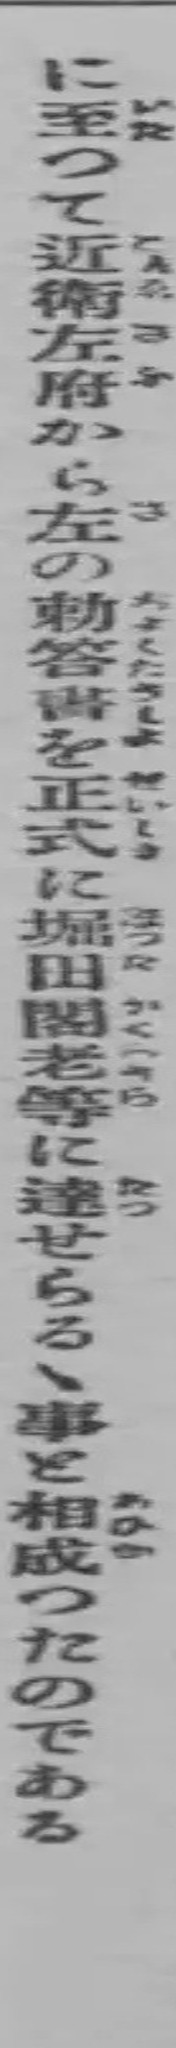に至つて近衛左府から左の勅答書を正式に堀田閣老等に達せらるゝ事と相成つたのである
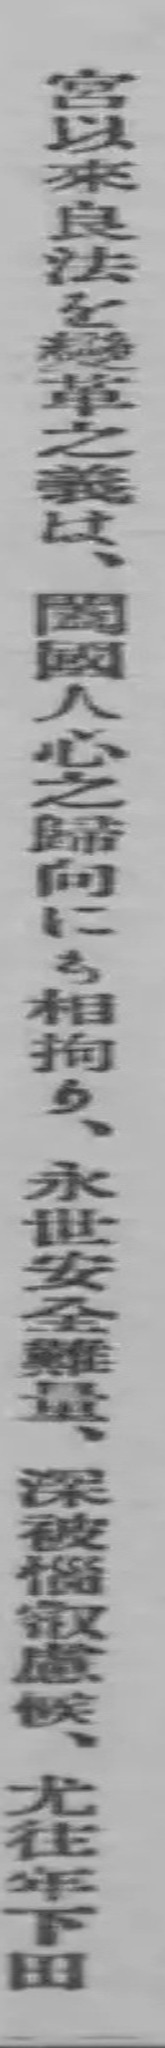宮以来良法を変革之義は、闔国人心之帰向にも相拘り、永世安全難量、深被悩叡慮候、尤往年下田
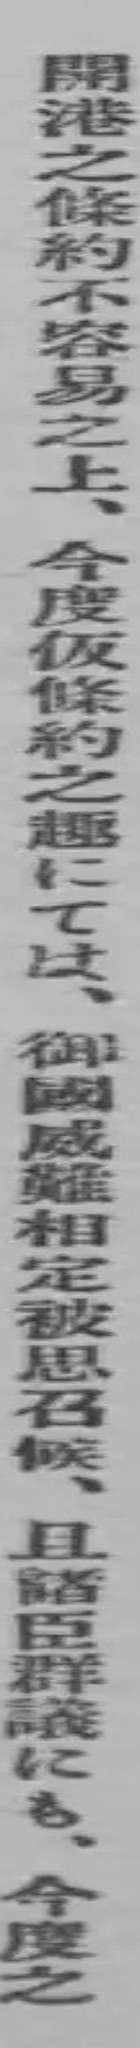開港之条約不容易之上、今度仮条約之趣にては、御国威難相定被思召候、且諸臣群議にも、今度之
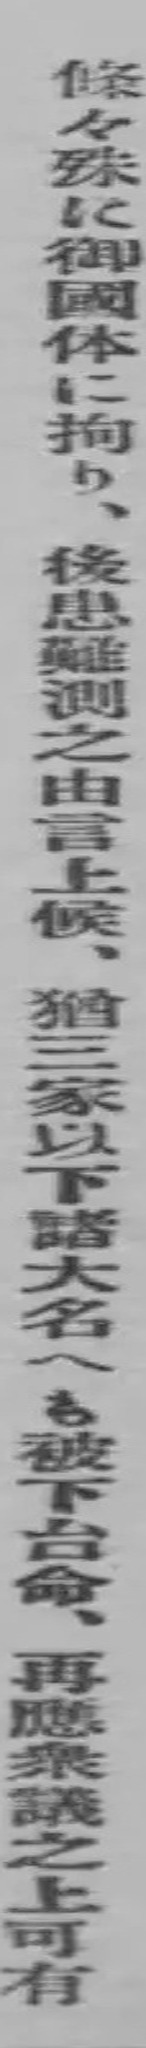条々殊に御国体に拘り、後患難測之由言上候、猶三家以下諸大名へも被下台命、再応衆議之上可有
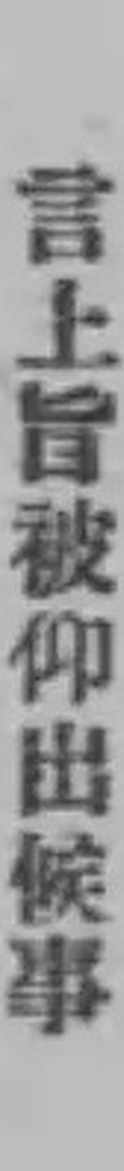言上旨被仰出候事
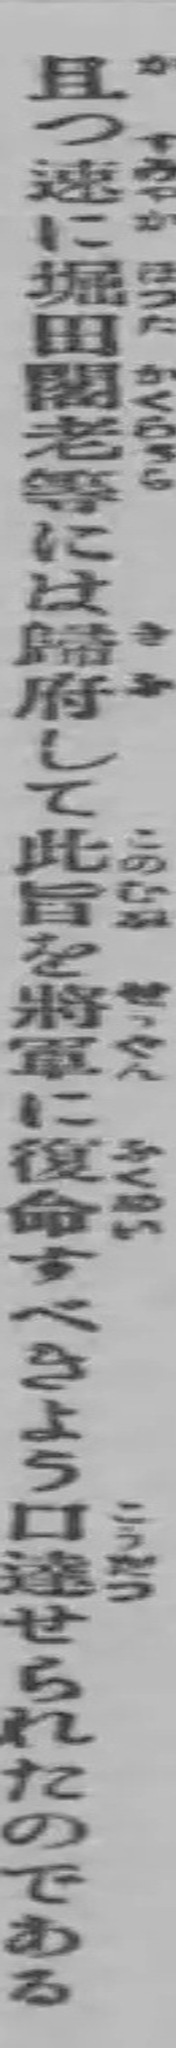且つ速に堀田閣老等には帰府して此旨を将軍に復命すべきよう口達せられたのである
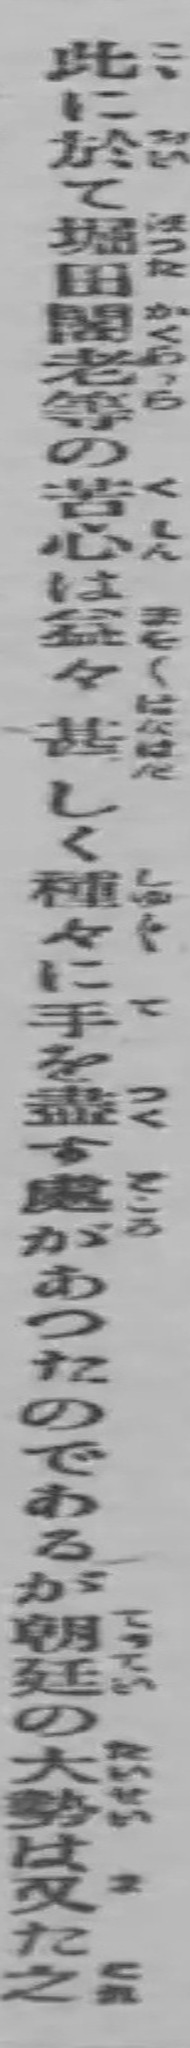此に於て堀田閣老等の苦心は益々甚しく種々に手を尽す処があつたのであるが朝廷の大勢は又た之
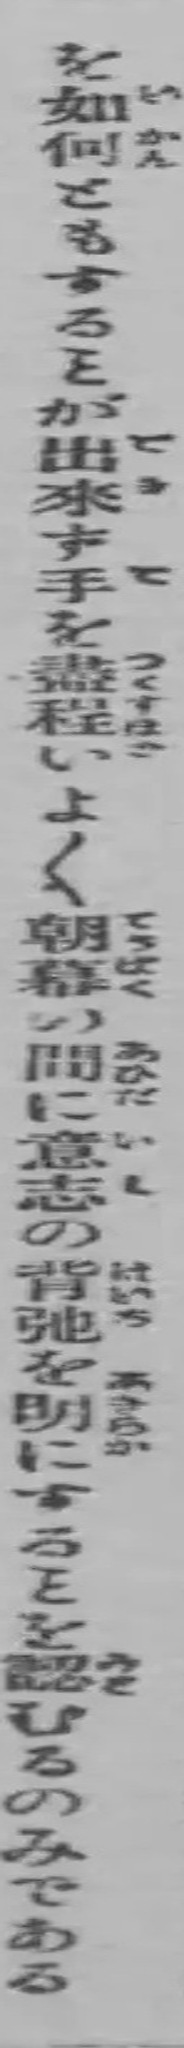を如何ともすることが出来ず手を尽程いよ〳〵朝幕の間に意志の背弛を明にすることを認むるのみである
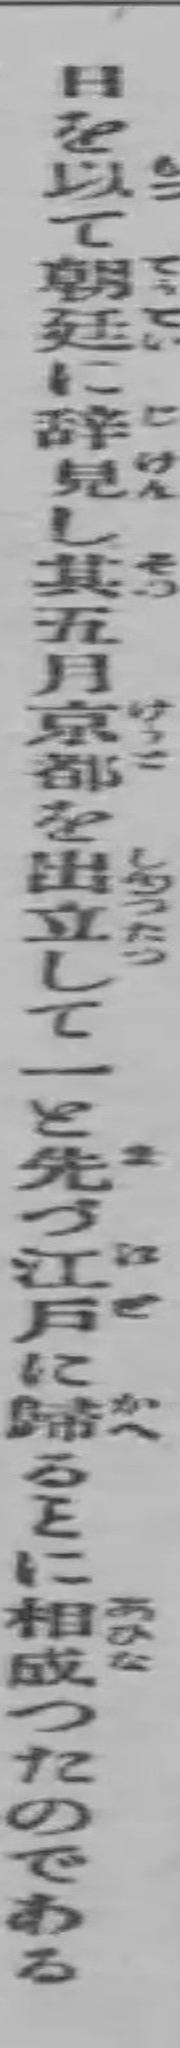日を以て朝廷に辞見し其五月京都を出立して一と先づ江戸に帰ることに相成つたのである
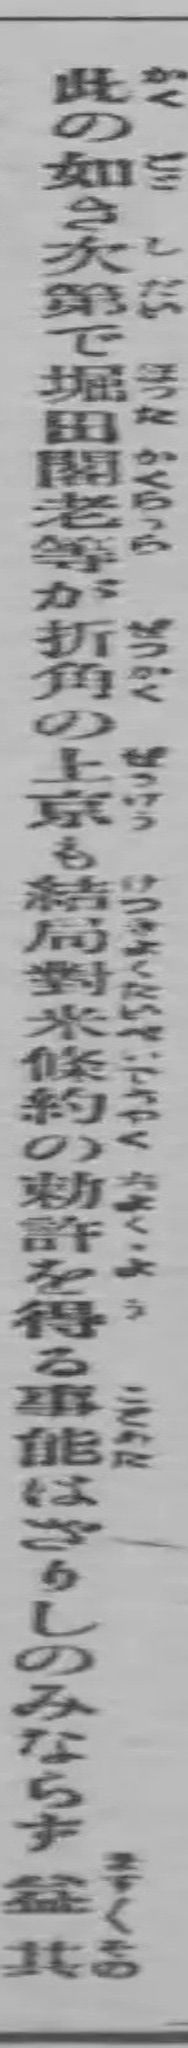此の如き次第で堀田閣老等が折角の上京も結局対米条約の勅許を得る事能はざりしのみならず益其
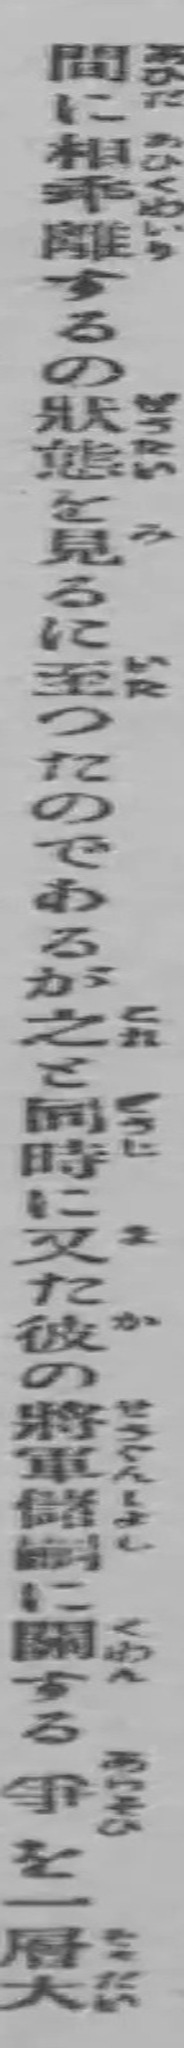間に相乖離するの状態を見るに至つたのであるが之と同時に又た彼の将軍儲嗣に関する争を一層大
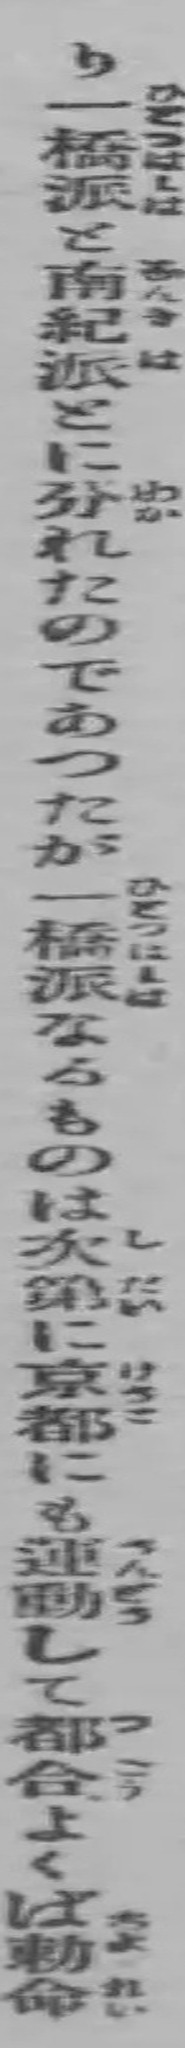り一橋派と南紀派とに分れたのであつたが一橋派なるものは次第に京都にも運動して都合よくば勅命
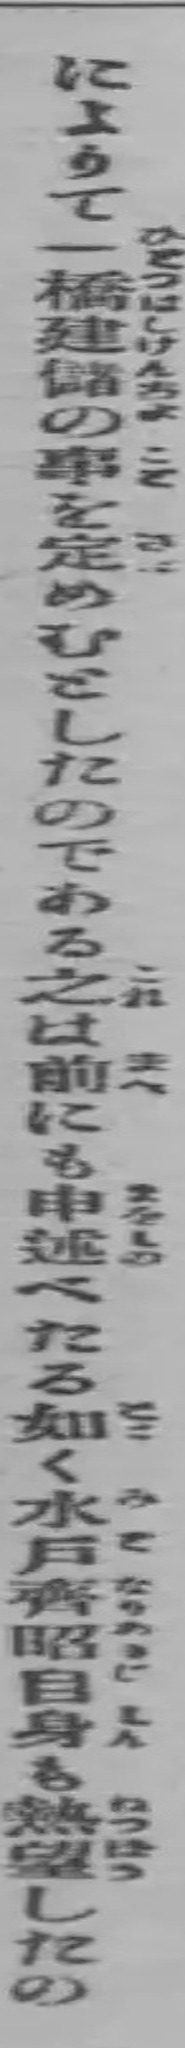によりて一橋建儲の事を定めむとしたのである之は前にも申述べたる如く水戸斉昭自身も熱望したの
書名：豊橋市史談
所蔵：国立国会図書館 National Diet Library, JAPAN
